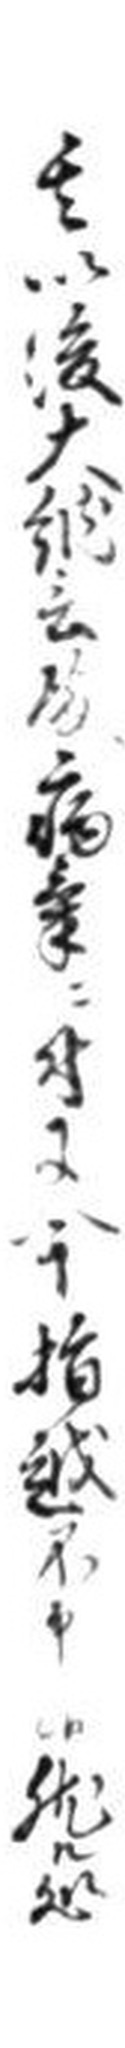其以後大納言殿病気ニ付而今指越不申候然ル処
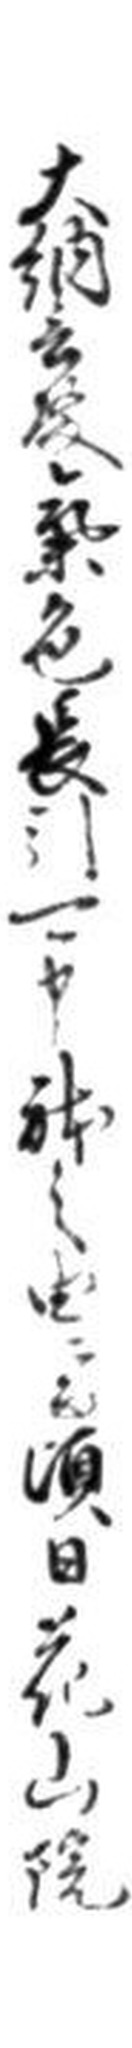大納言殿気色長引可申体之由ニ而頃日花山院
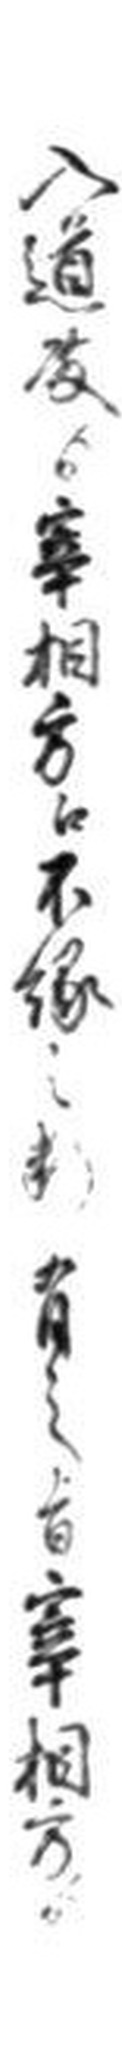入道殿ゟ宰相方江不縁之断有之旨宰相方ゟ
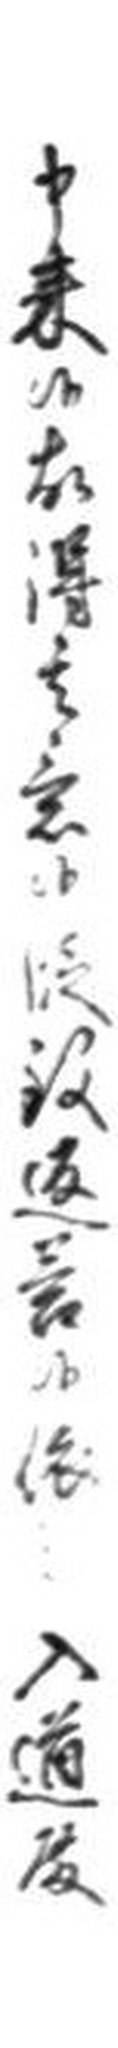申来候故得其意候段致返答候依之入道殿
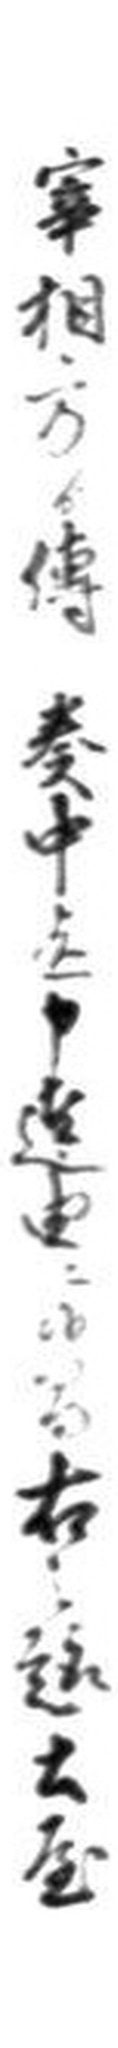宰相方ゟ伝奏中迄申達由ニ候間右之趣土屋
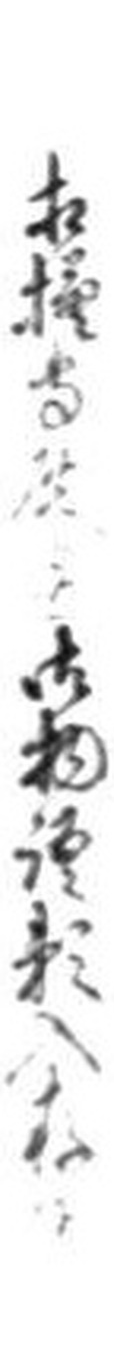相模守殿迄御物語頼入存候
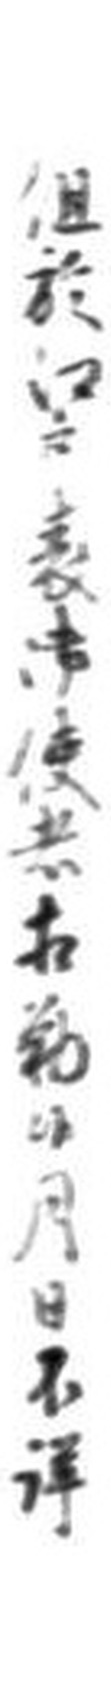但於江戸表御使者相勤候月日不詳
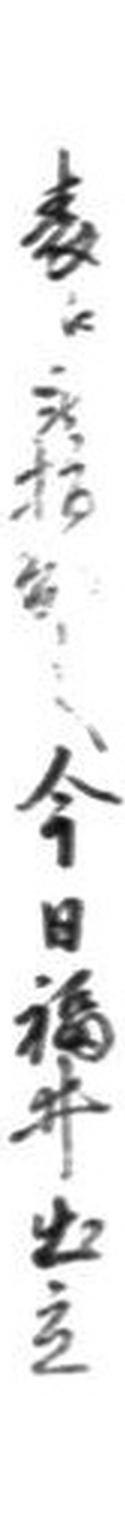表江被指出之今日福井出立

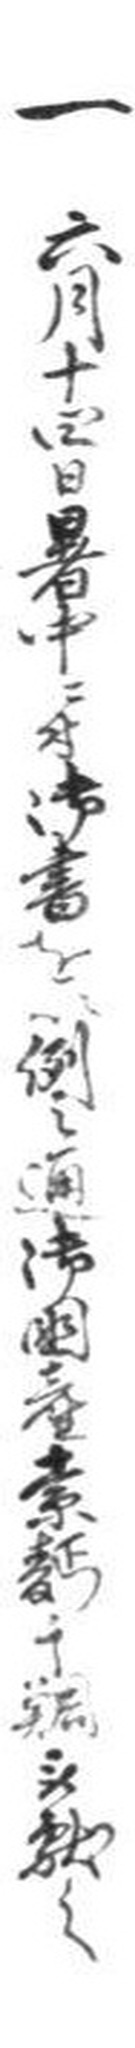一六月十四日暑中ニ付御書を以例之通御国産素麺干鯛被献之
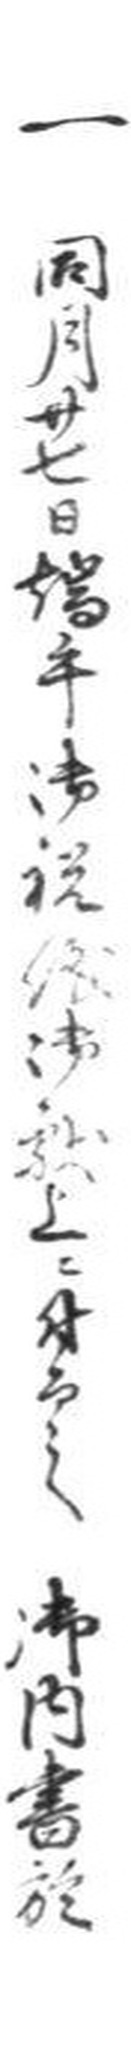一同月廿七日端午御祝儀御献上ニ付而之御内書於
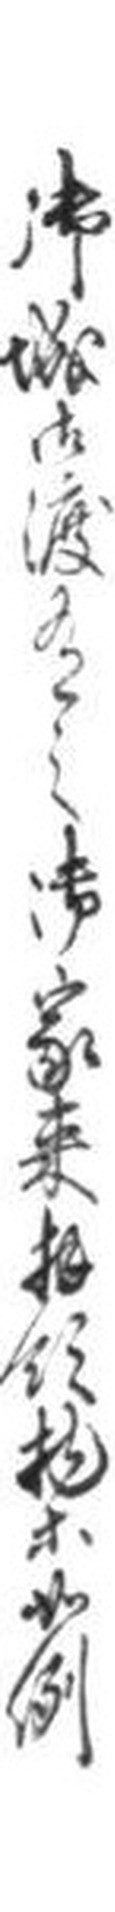御城御渡有之御家来拝領物等如例
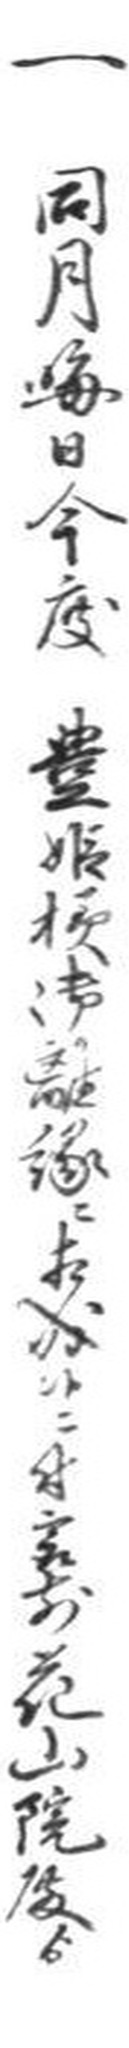一同月晦日今度豊姫様御離縁ニ相成候ニ付最前花山院殿ゟ
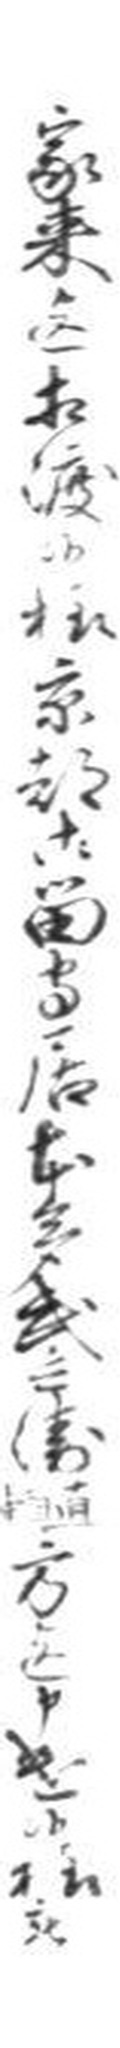家来迄相渡候様京都御留守居本多武兵衛直頼方迄申遣候様被
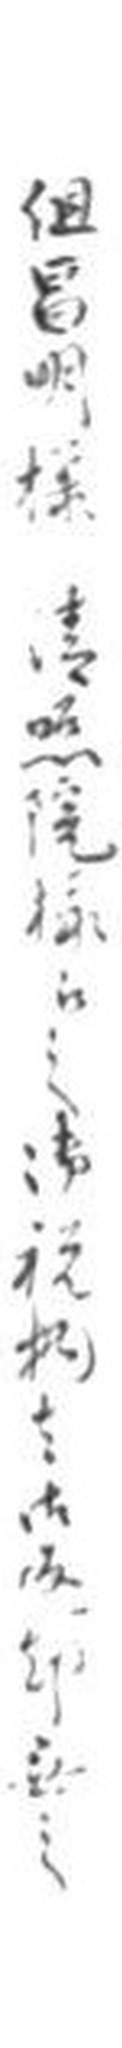但昌明様清照院様江之御祝物者御返却無之
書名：家譜 二十二 吉品公 従元禄十五年到同十六年
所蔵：福井県文書館 Fukui Prefectural Archives
